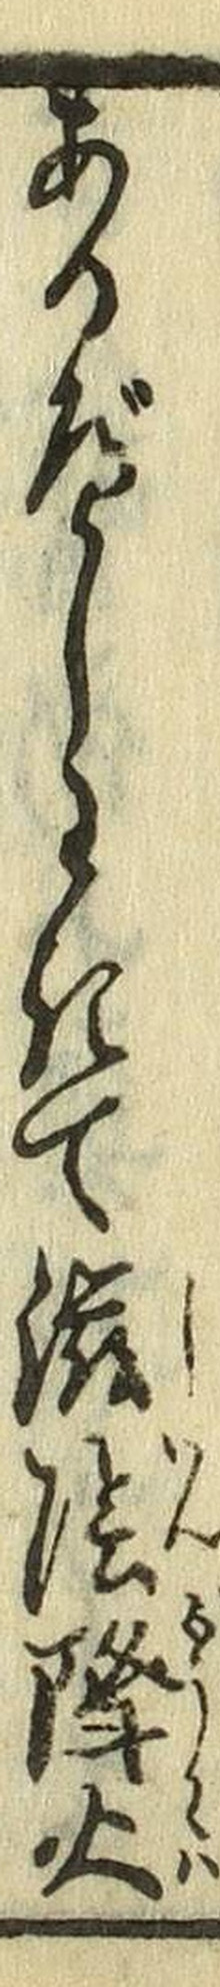あるべしわきて滋陰降火
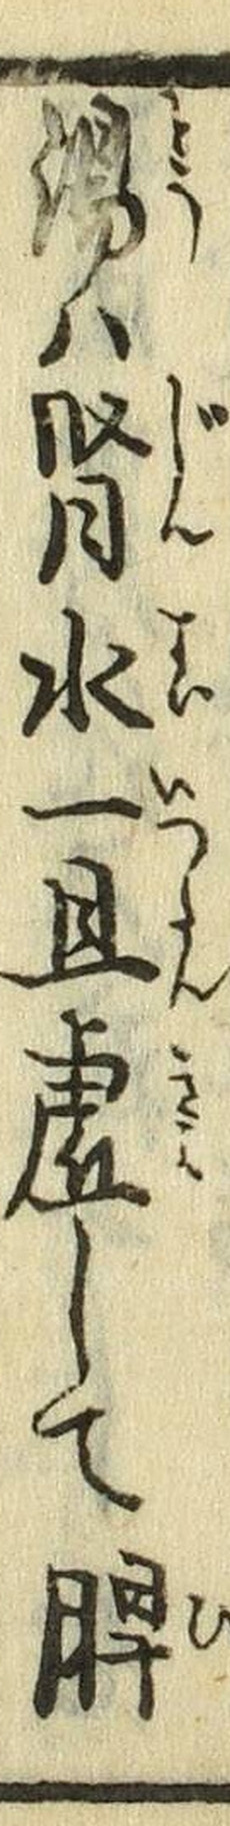湯は腎水一旦虚して脾
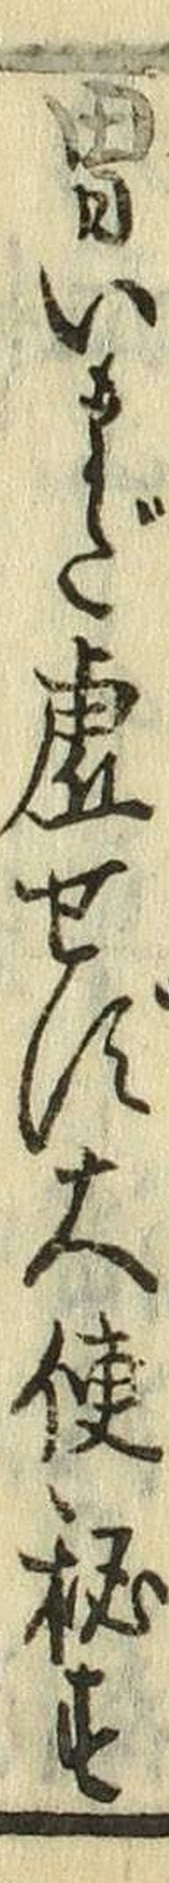胃いまだ虚せず大便秘す
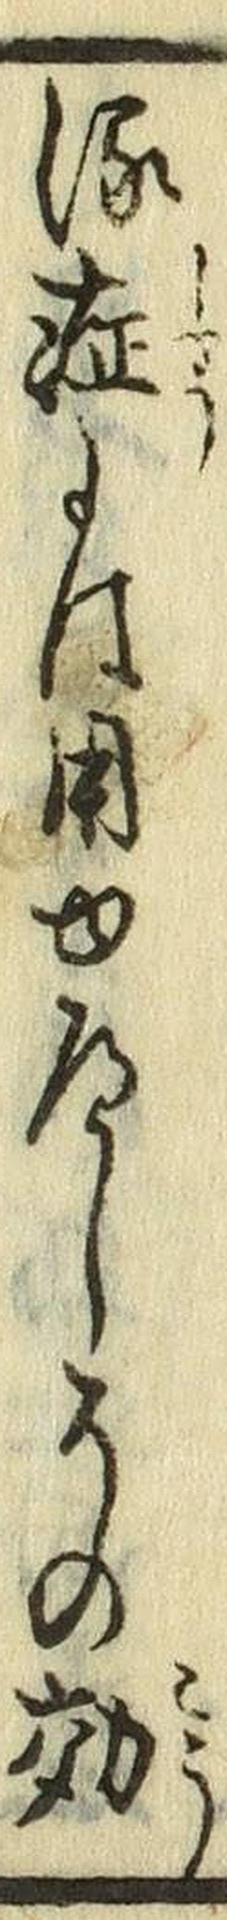る症には用ゆへしその効
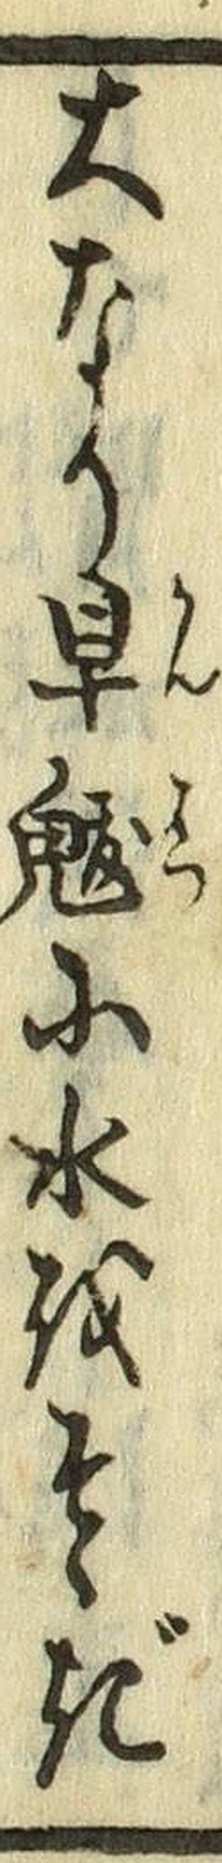大なり旱魃に水をそゝぎ
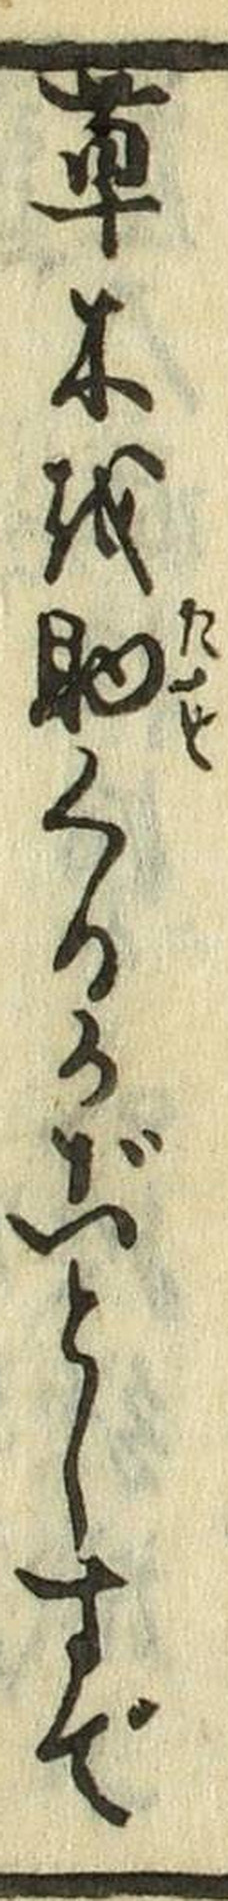草木を助くるかごとしすで
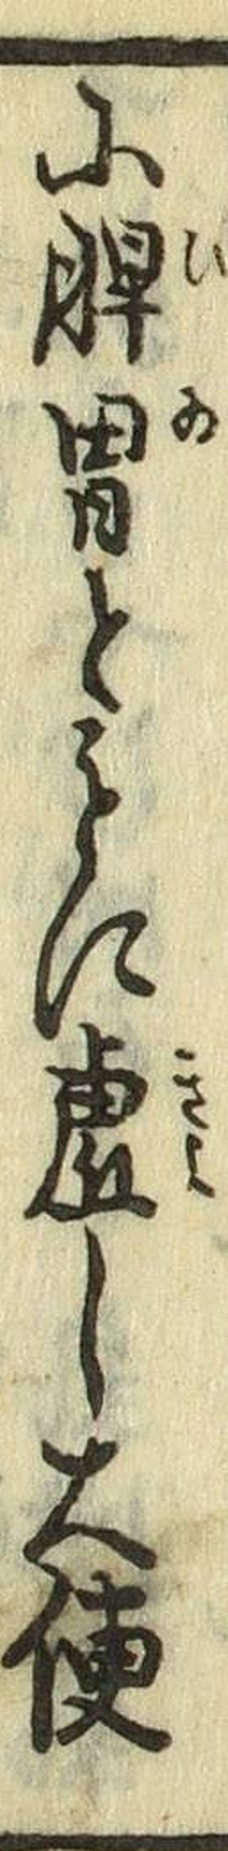に脾胃ともに虚し大便
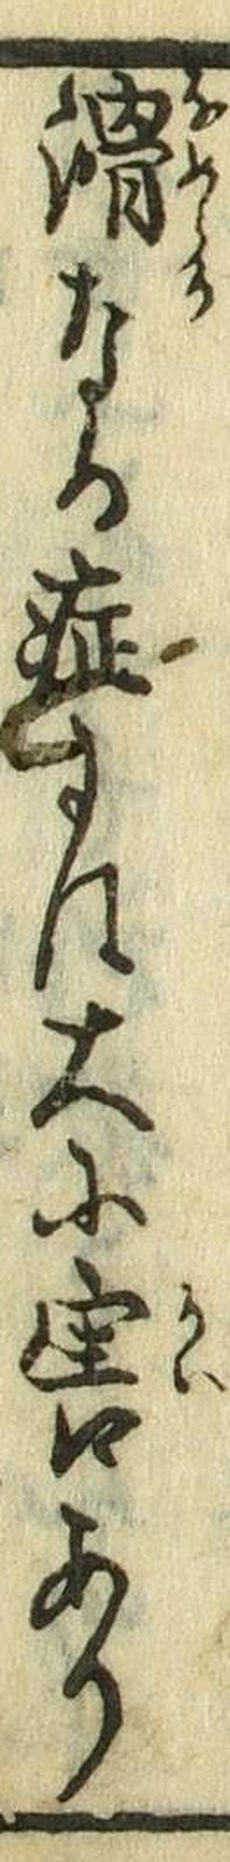滑なる症には大に害あり
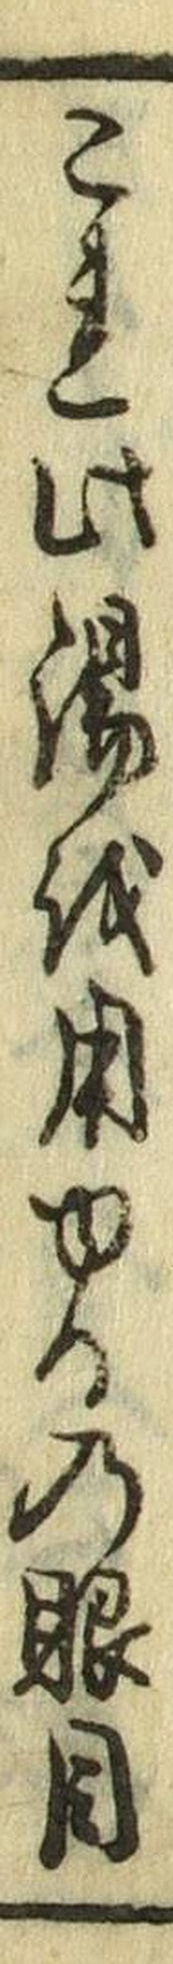これ此湯を用ゆるの眼目

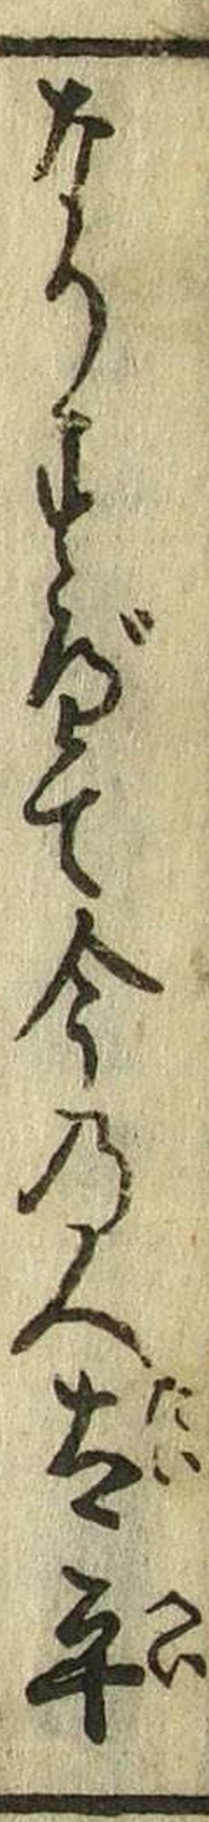なりすべて今の人太平
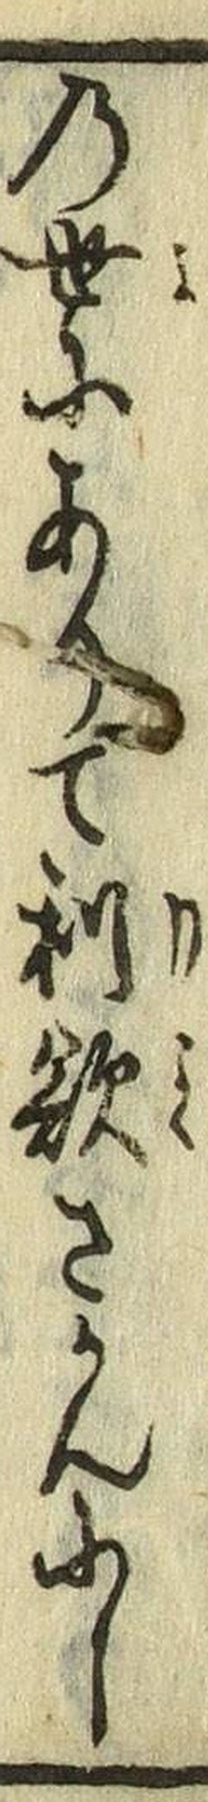の世にありて利欲さかんにし
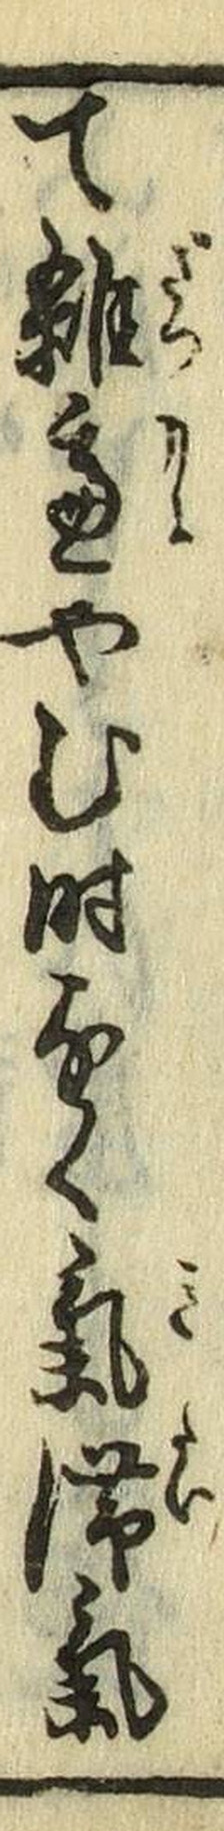て雑慮やむ時なく気滞気
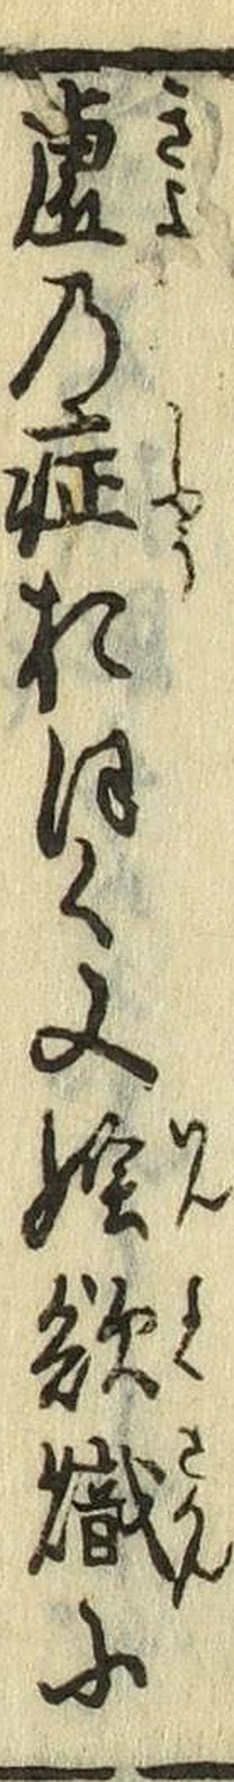虚の症おほく又婬欲熾に
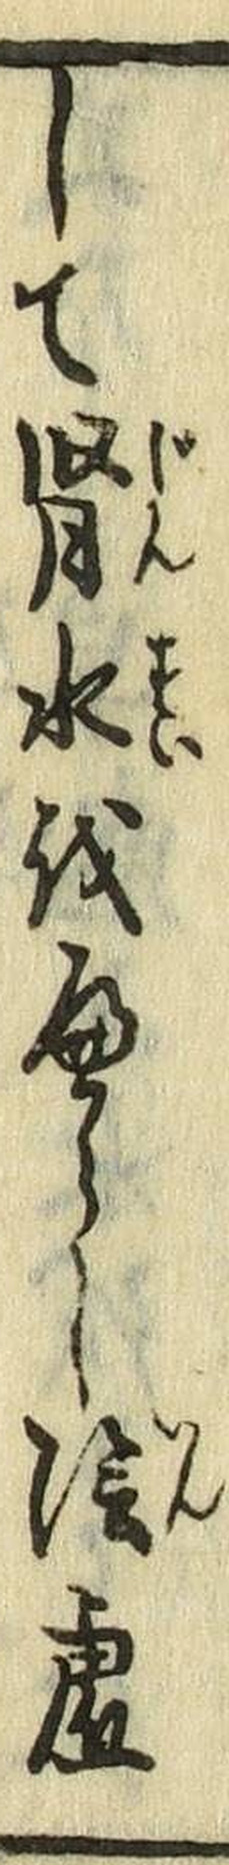して腎水をへらし陰虚
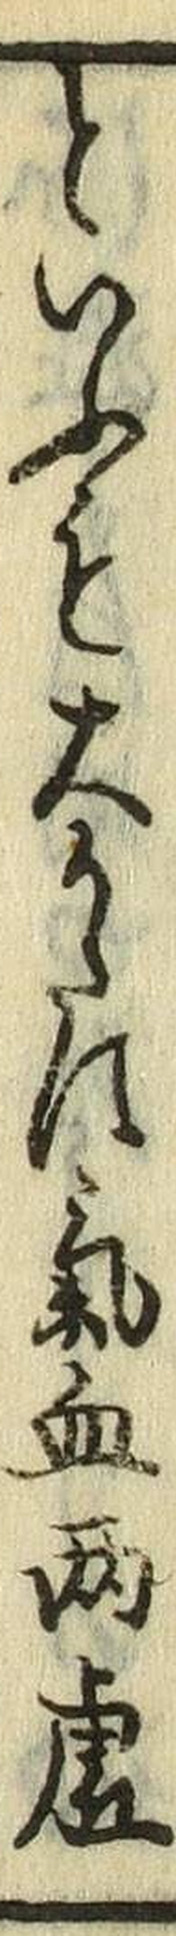といふも大かたは気血両虚
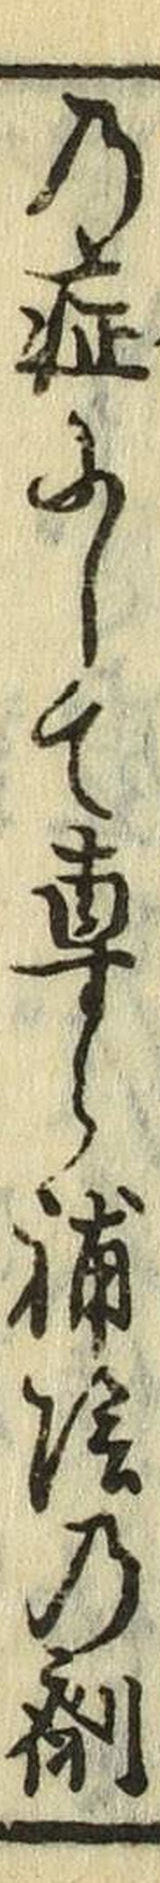の症にして専ら補陰の剤
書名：居家養生記
